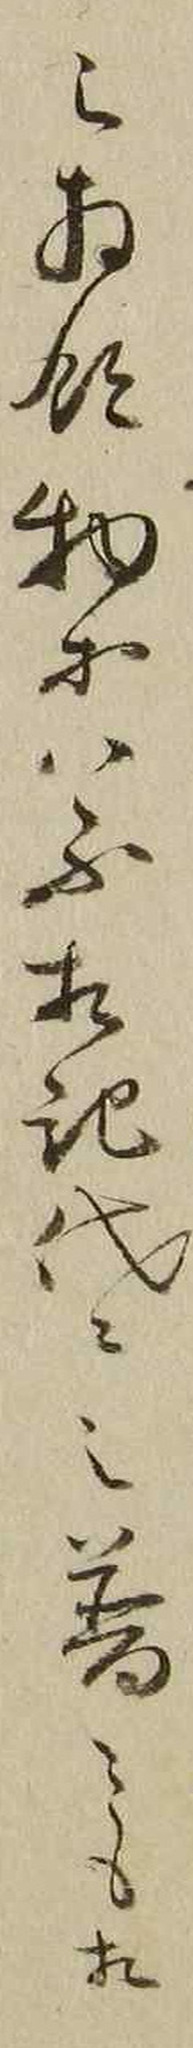之拝領物等は不相記代々之著にも相
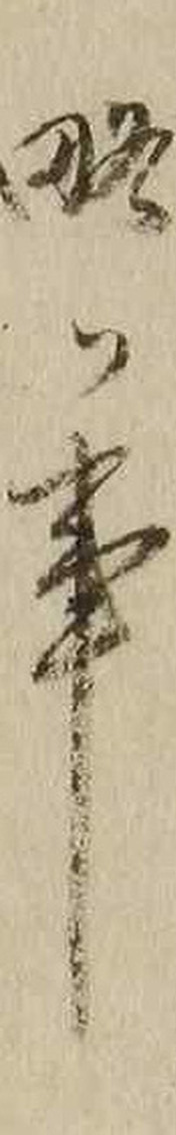略候事
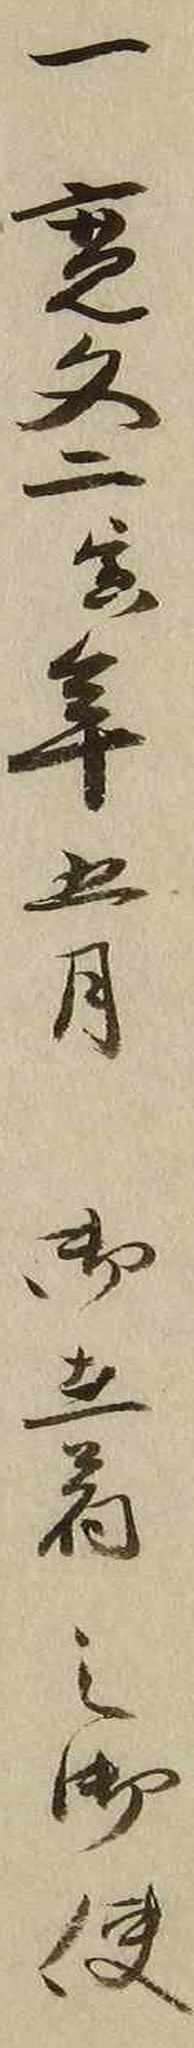一寛文二寅年五月御在府之御使者
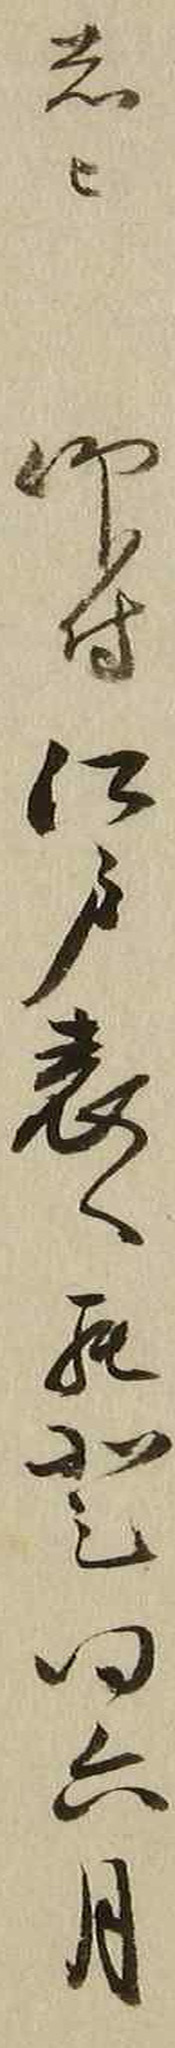被仰付江戸表へ罷登同六月
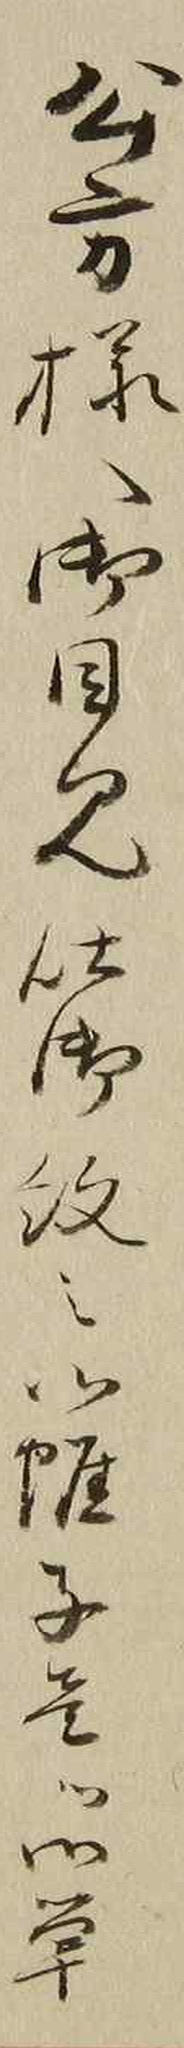公方様へ御目見仕御紋之御帷子壱つ御単
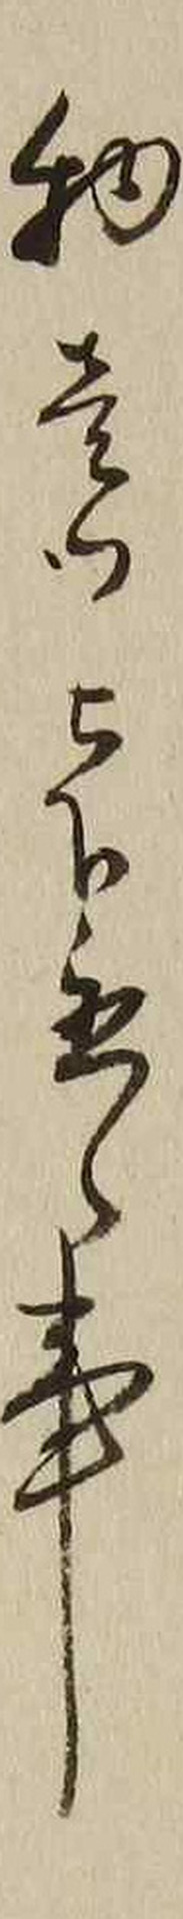物壱つ被下置候事
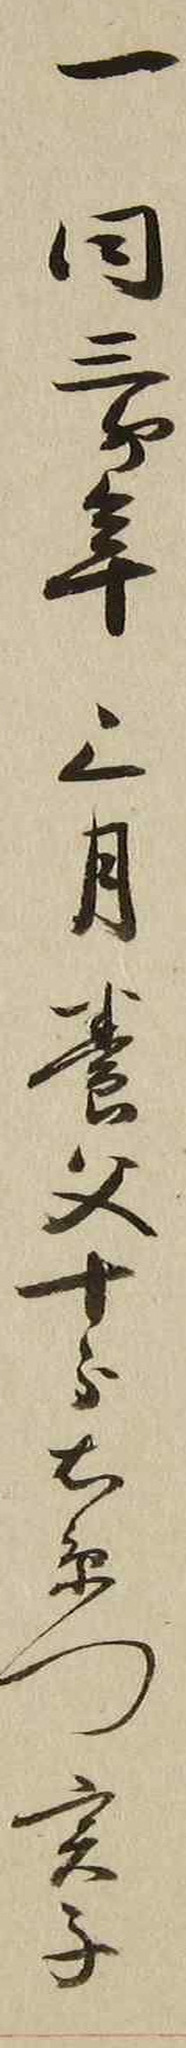一同三卯年三月養父十郎右衛門実子
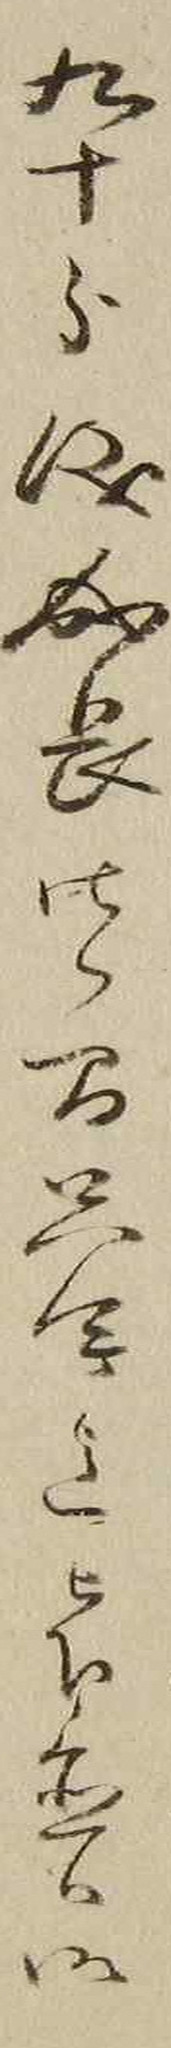九十郎儀成長仕候間只今迄被下置候御
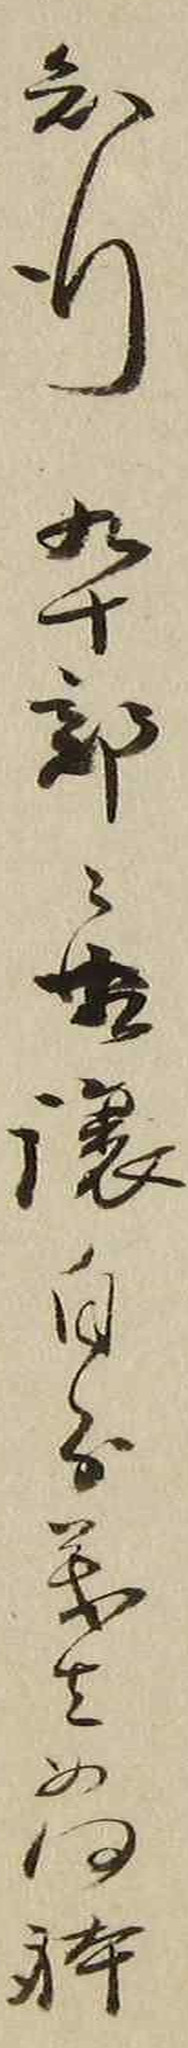知行九十郎に相譲自分義は如何体
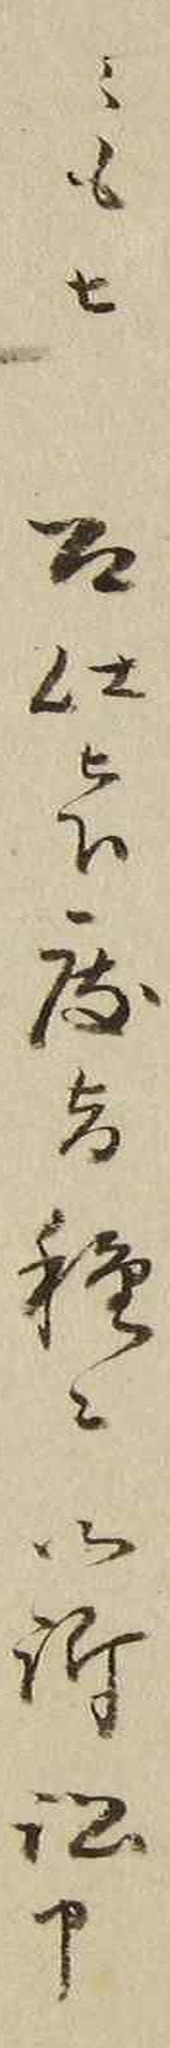にも被召仕被下度旨種々御訴訟申
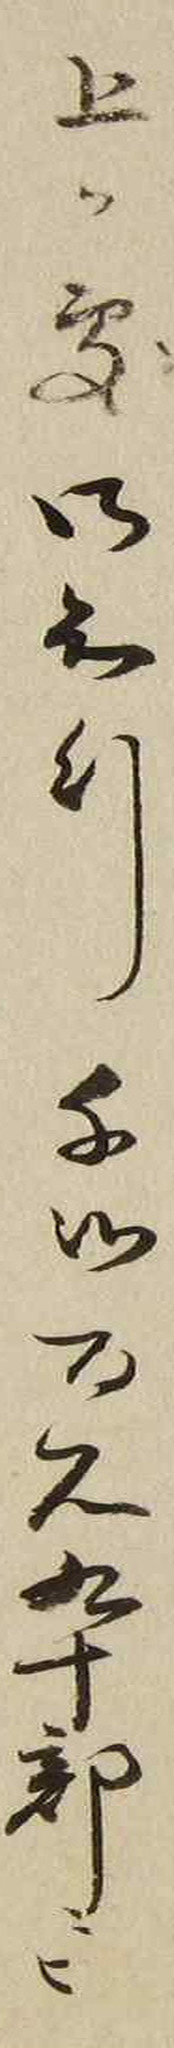上候処御知行千弐百石九十郎に被
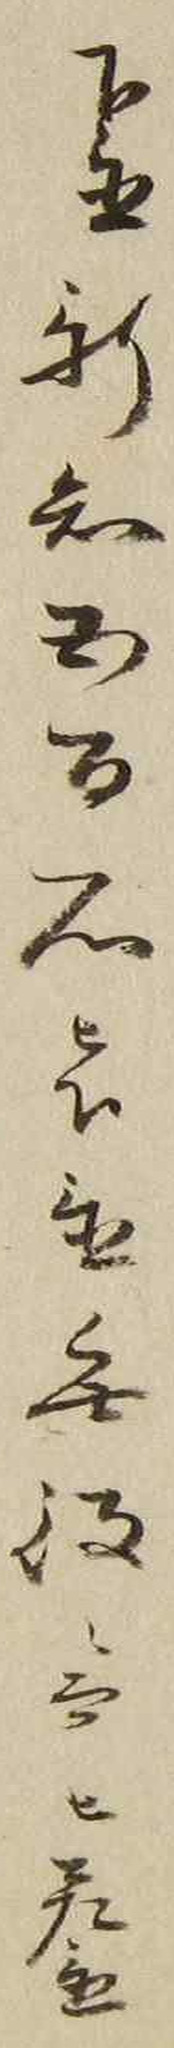下置新知五百石被下置無役に而被差置
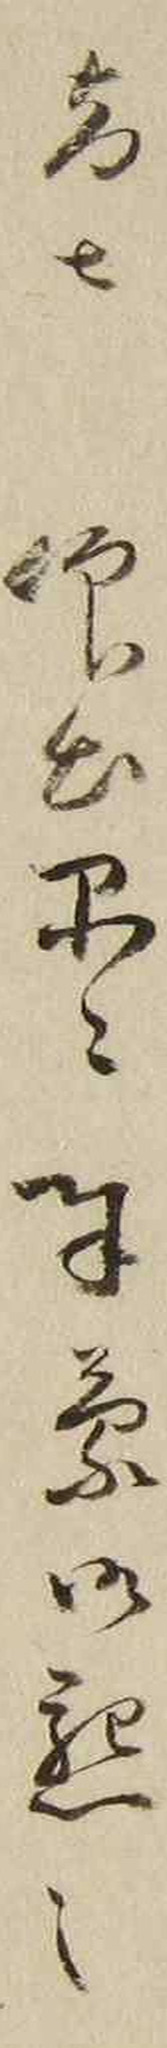旨被仰出早々奉蒙御懇之
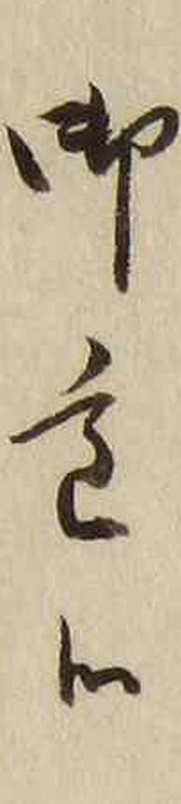御意候

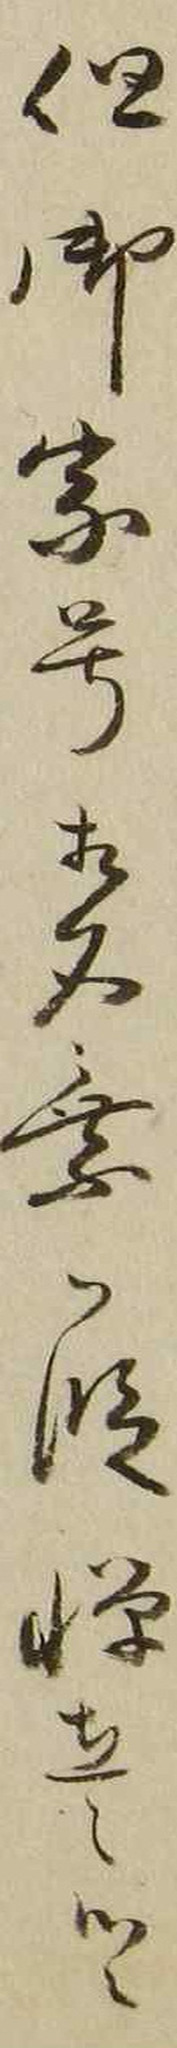但御家号相名乗候段憚有之候に
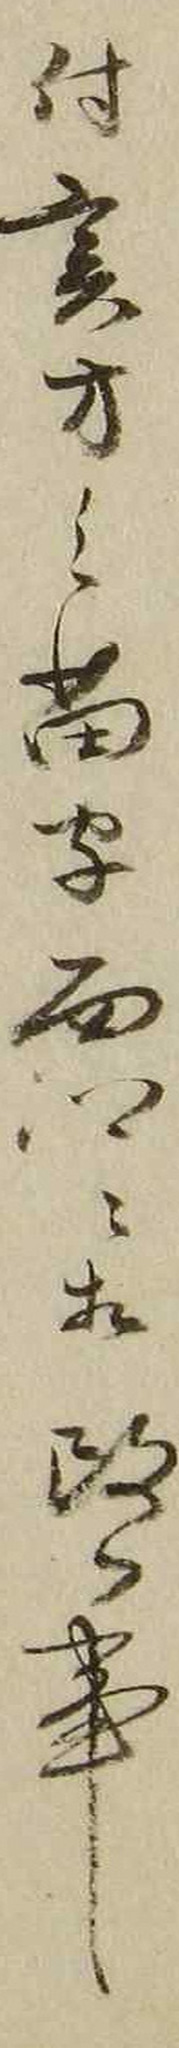付実方之苗字西郷に相改候事
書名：諸士系譜　巻之269　さ之部1
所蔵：会津若松市立会津図書館
